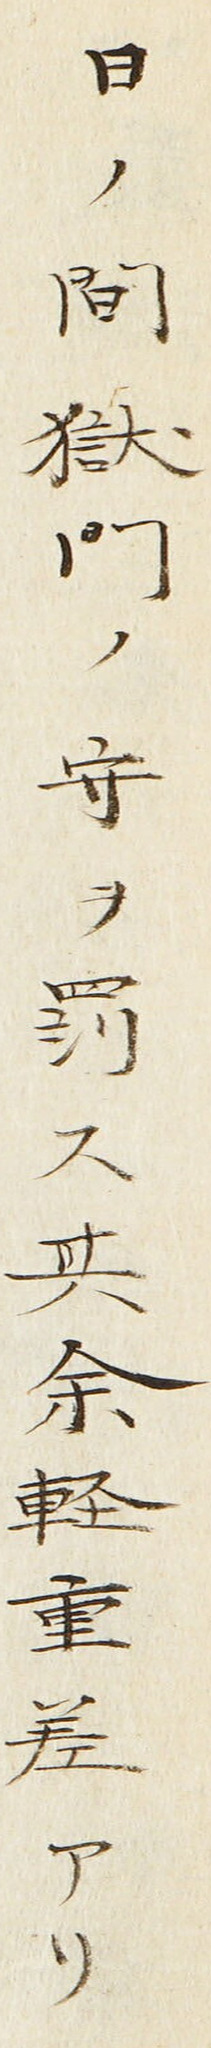日ノ間獄門ノ守ヲ罰ス其余軽重差アリ
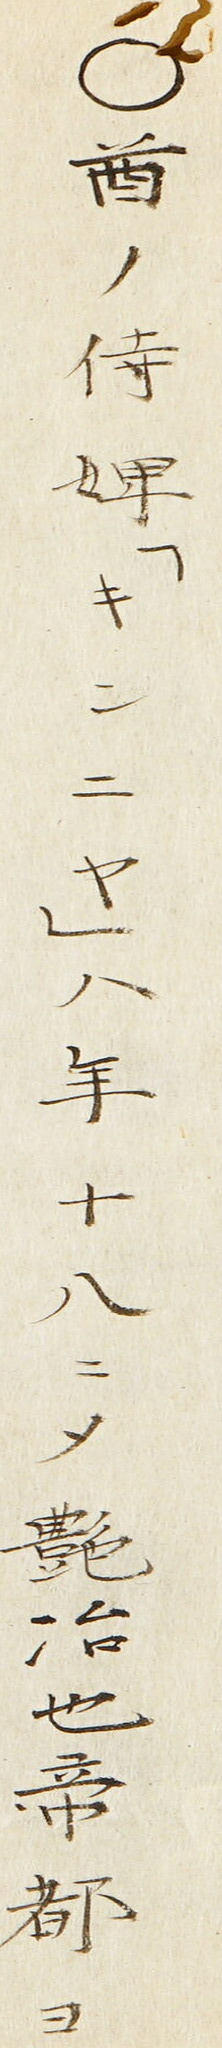○酋ノ侍婢「キンニヤ」ハ年十八ニシテ艶冶也帝都ヨ
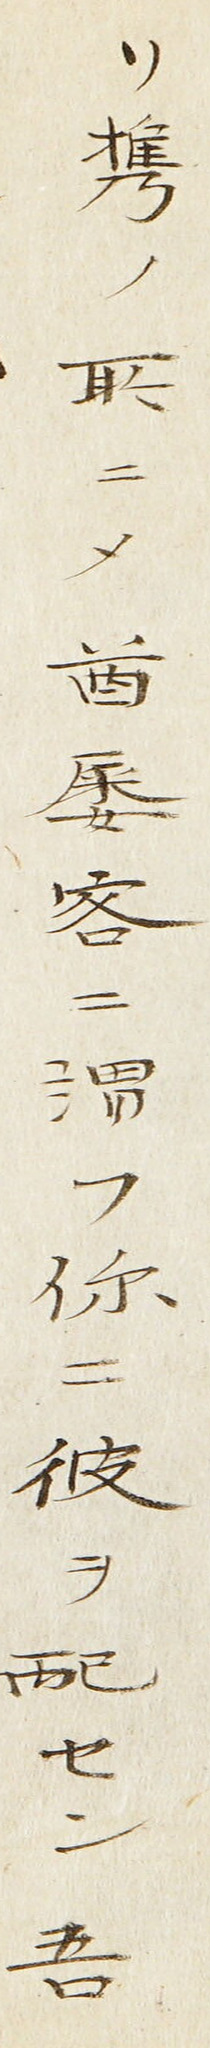リ携ノ所ニシテ酋屡客ニ謂フ你ニ彼ヲ配セン吾
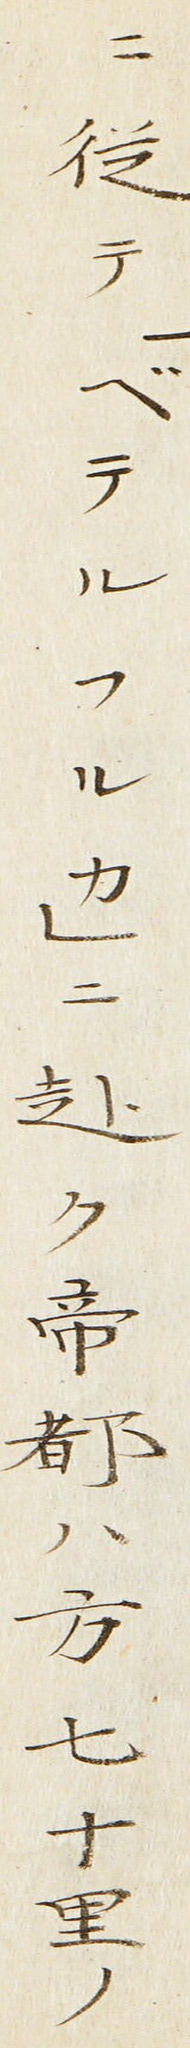ニ従テ「ベテルフルカ」ニ赴ク帝都ハ方七十里ノ
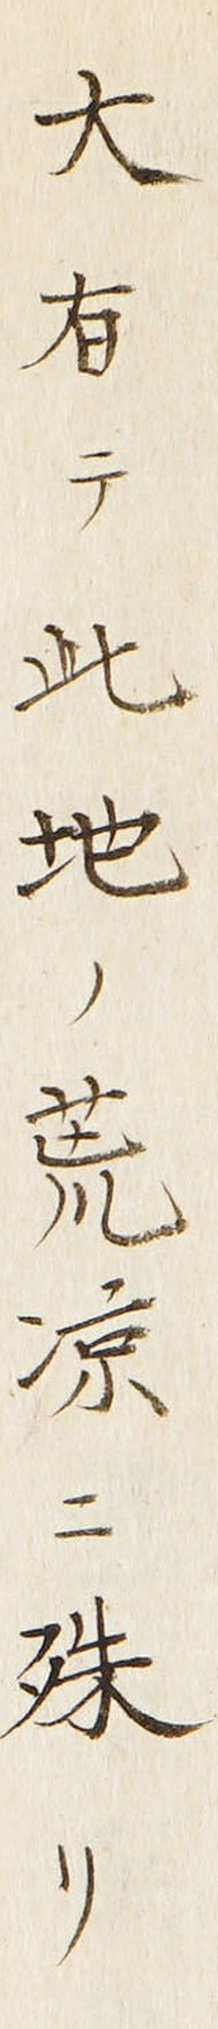大有テ此地ノ荒凉ニ殊リ
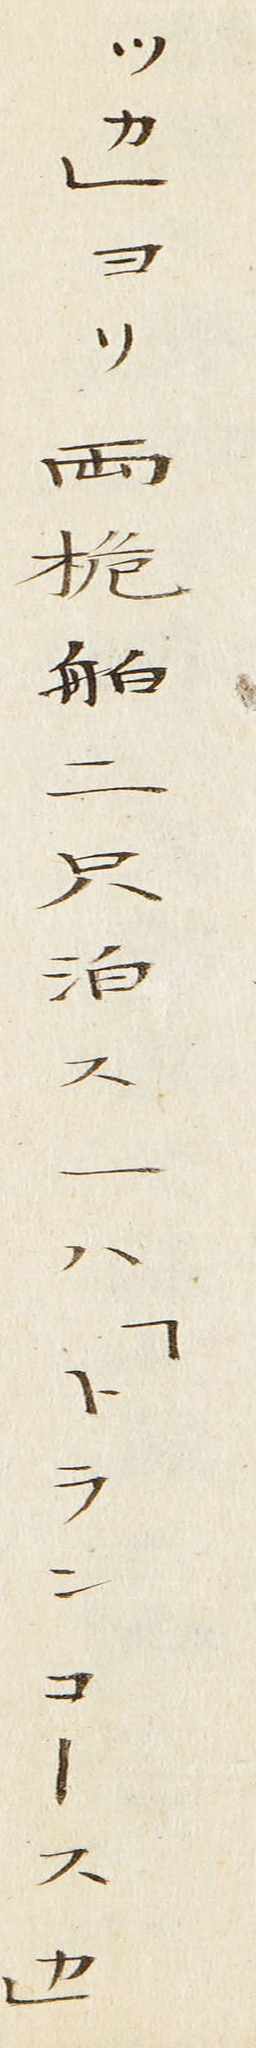ツカ」ヨリ両桅舶二只泊ス一ハ「トランコースカ」
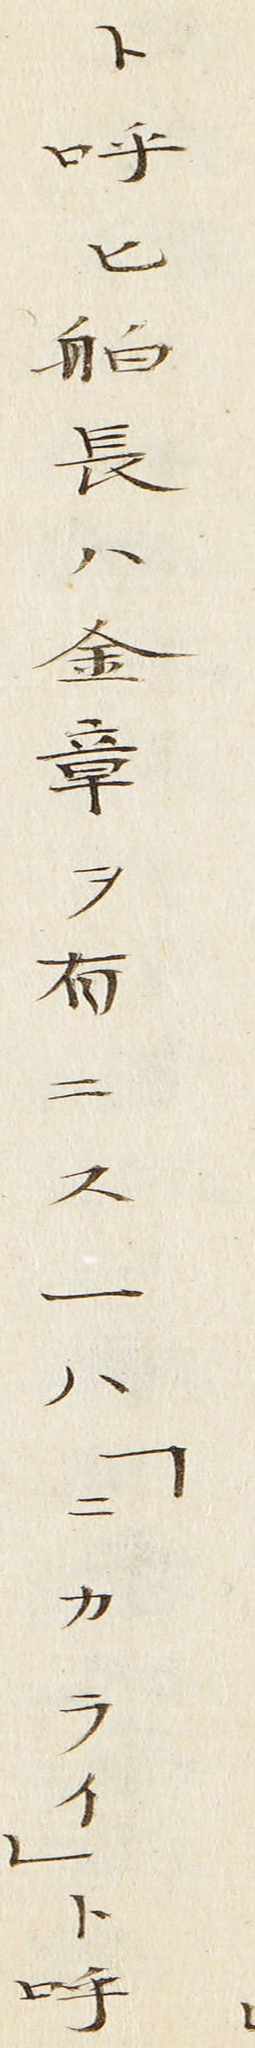ト呼ヒ舶長ハ金章ヲ有ニス一ハ「ニカライ」ト呼
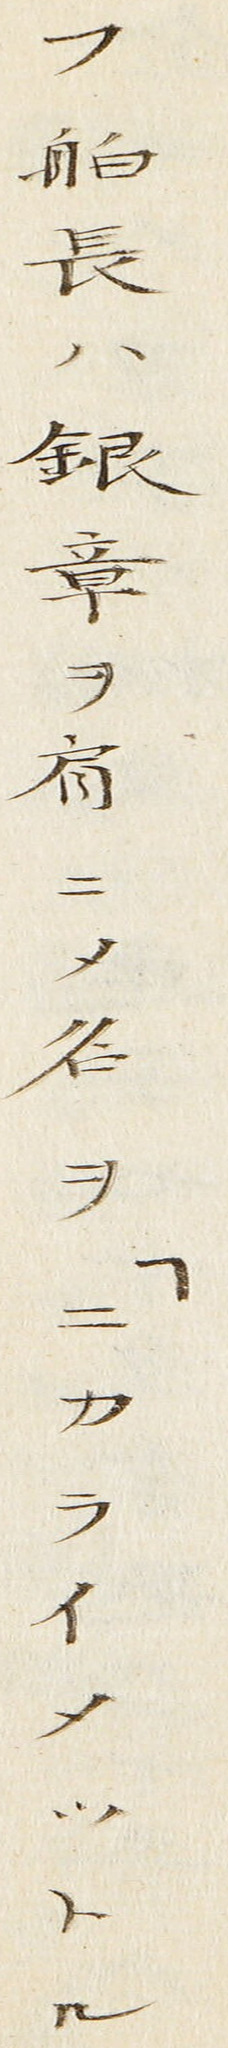フ舶長ハ銀章ヲ肩ニシテ名ヲ「ニカライメツトル
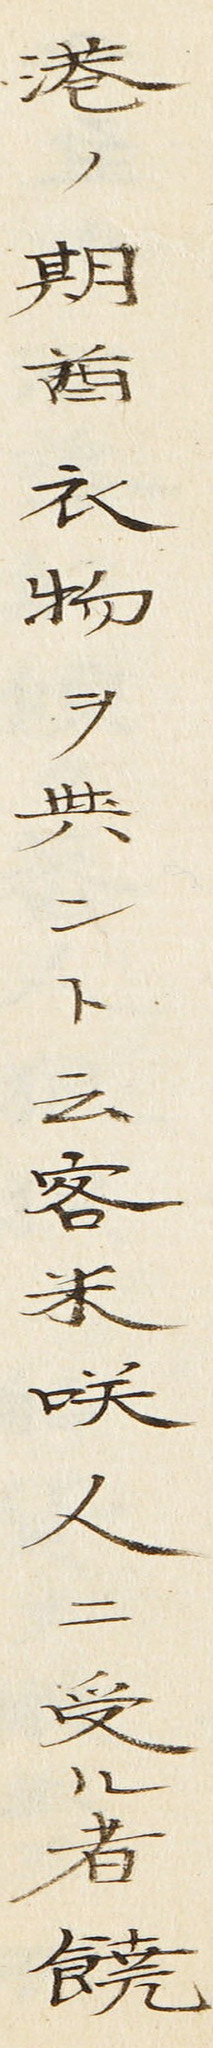港ノ期酋衣物ヲ与ント云客米咲人ニ受ル者饒
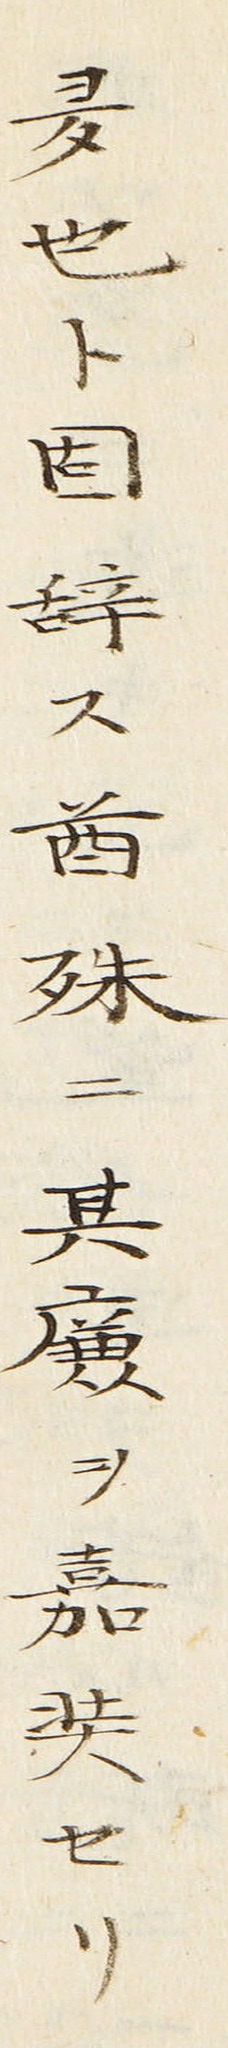多也ト固辞ス酋殊ニ其廉ヲ嘉奘セリ
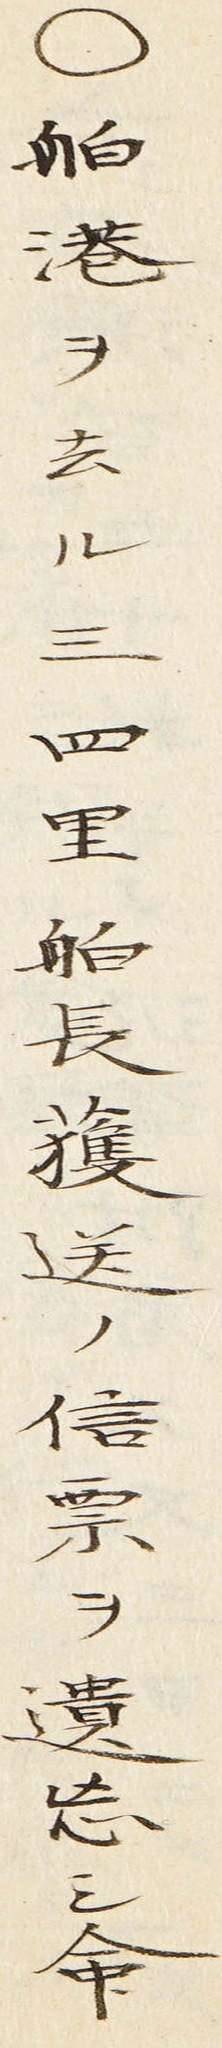○舶港ヲ去ル三四里舶長擭送ノ信票ヲ遺忘シ命
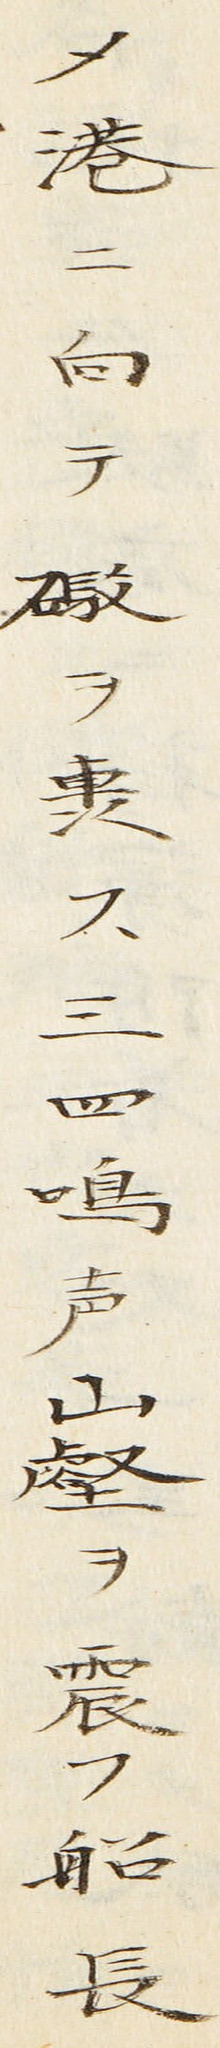シテ港ニ向テ礟ヲ軣ス三四鳴声山壑ヲ震フ船長
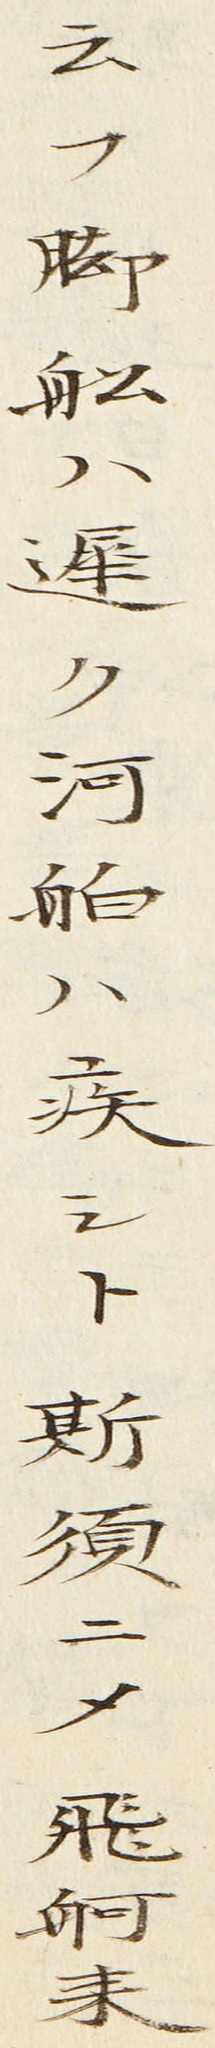云フ脚船ハ遅ク河舶ハ疾シト斯須ニシテ飛舸来
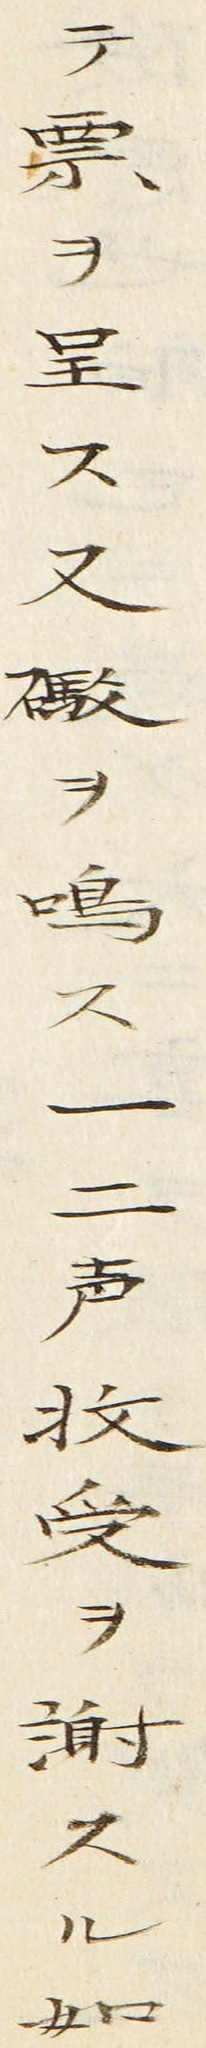テ票ヲ呈ス又礟ヲ鳴ス一二声収受ヲ謝スル如
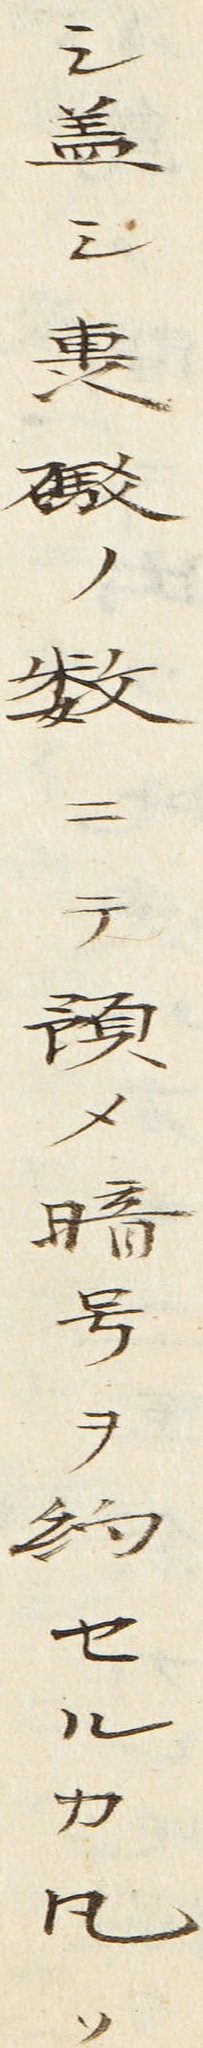シ盖シ軣礟ノ数ニテ預メ暗号約セルカ凡ソ
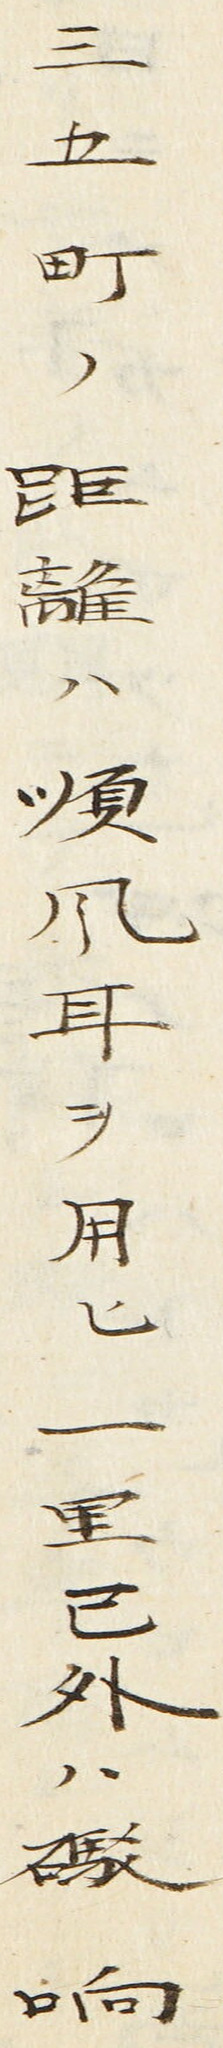三五町ノ距離ハ順風耳ヲ用ヒ一里已外ハ礟响
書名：流蕃通書
